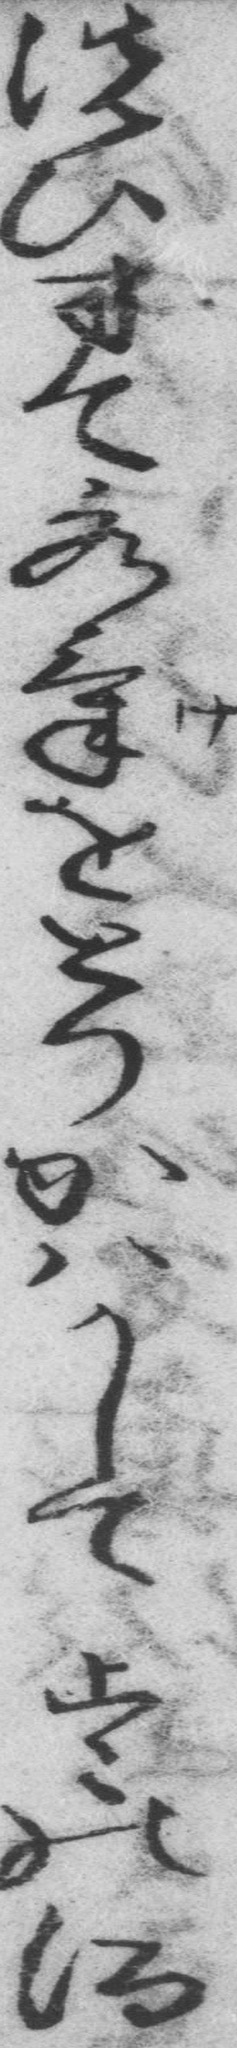洗ひすて水気をとりかはかして上々の酒
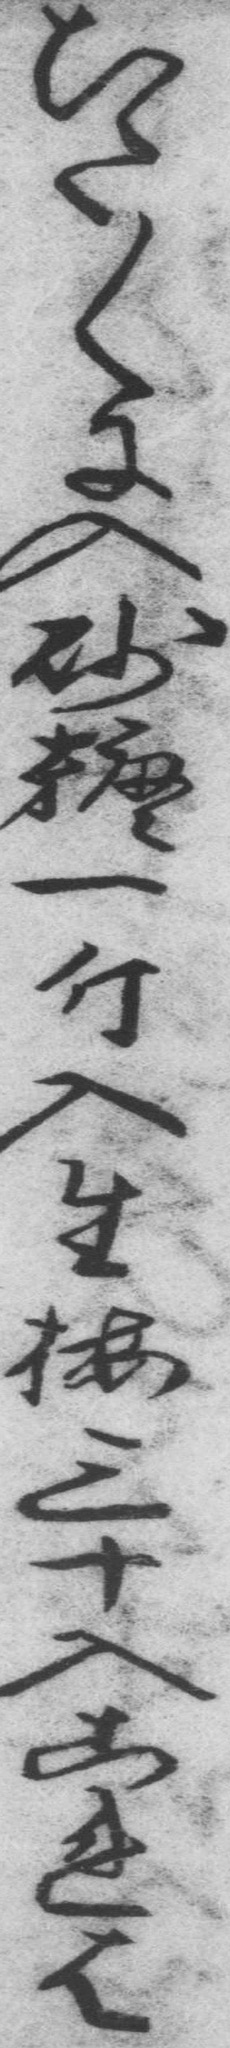ひた〳〵に入砂糖一斤入生梅三十入これは
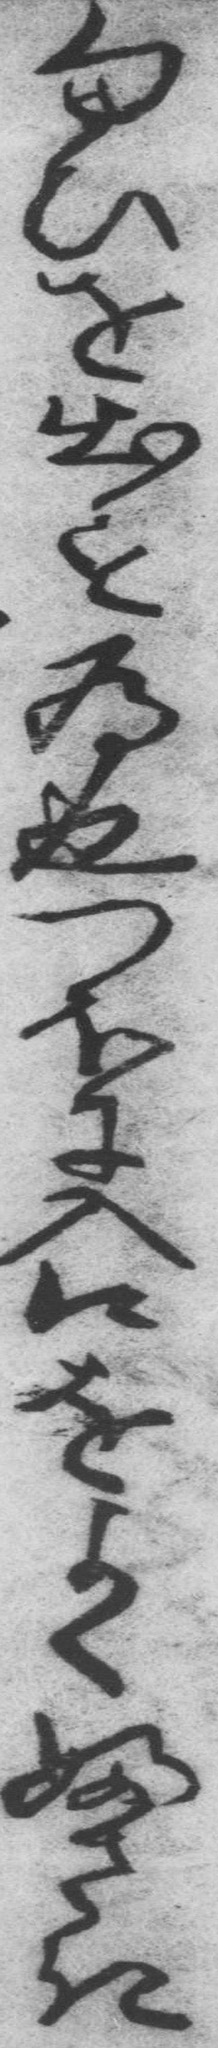匂ひを出す為也つほに入口をよくふさき
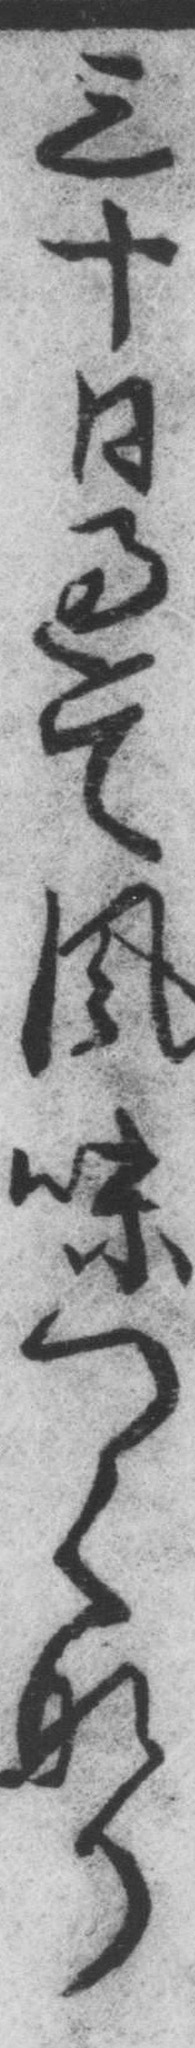三十日過て風味つくなり
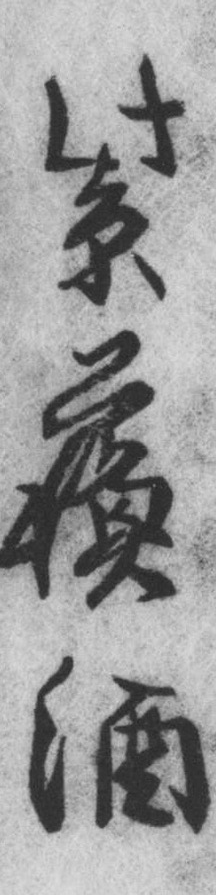紫蘇酒
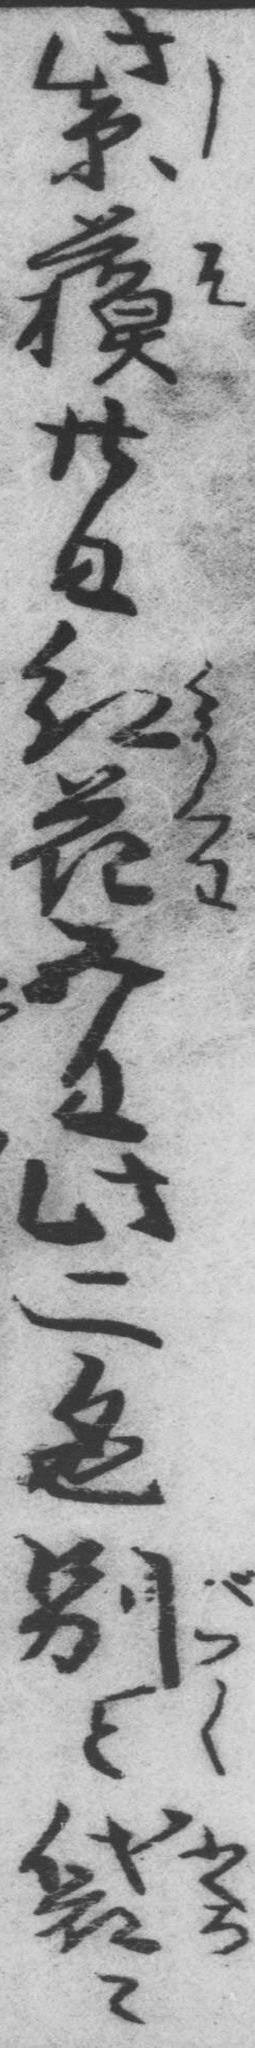紫蘇廿匁紅花五匁此二色別々袋に
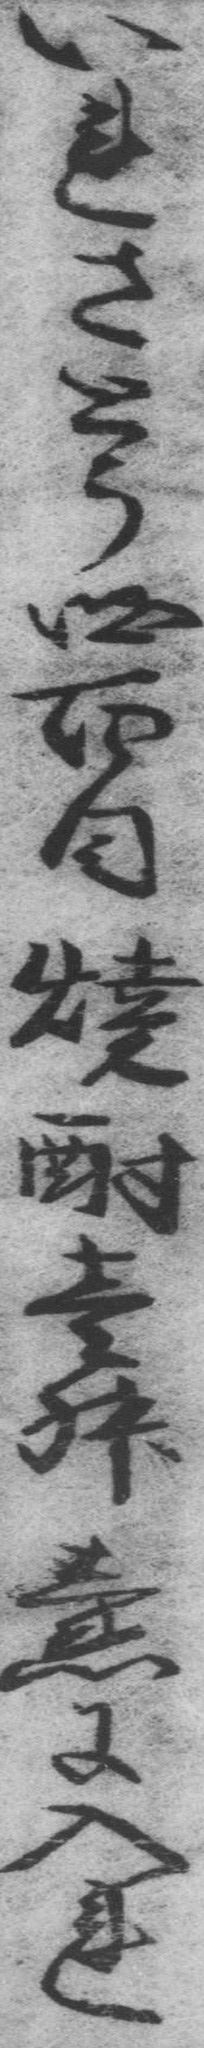いれさとう四百目焼酎壱升壺に入れ

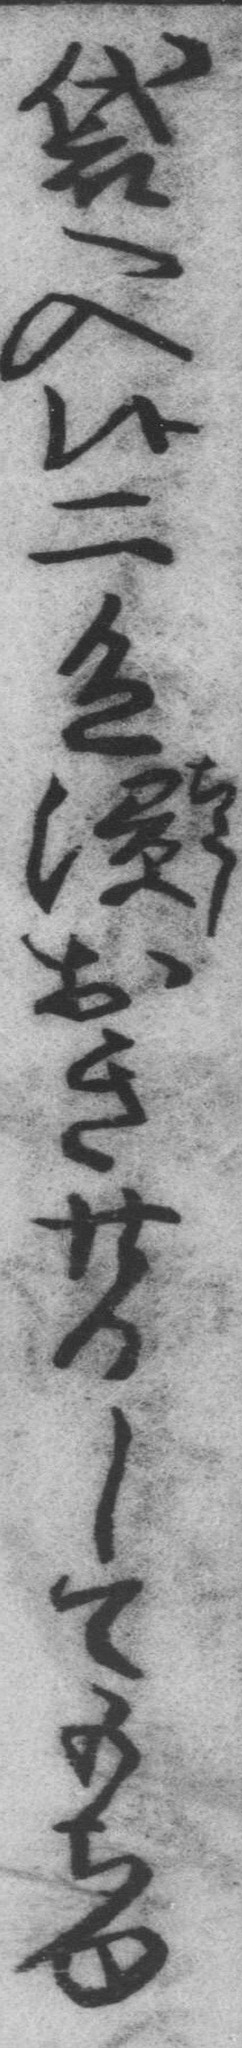袋へ入候二色浸おき廿日してもちゆ
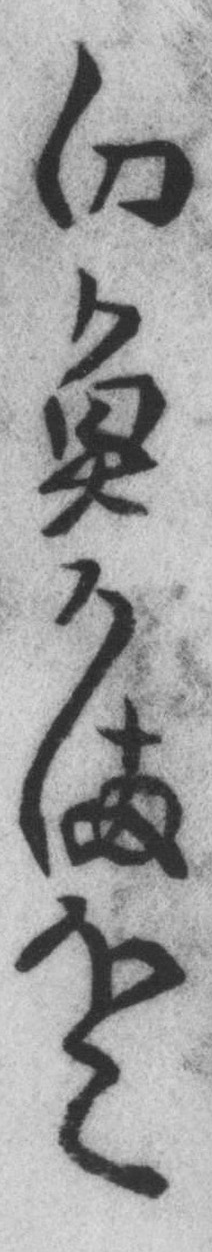白魚かまほこ
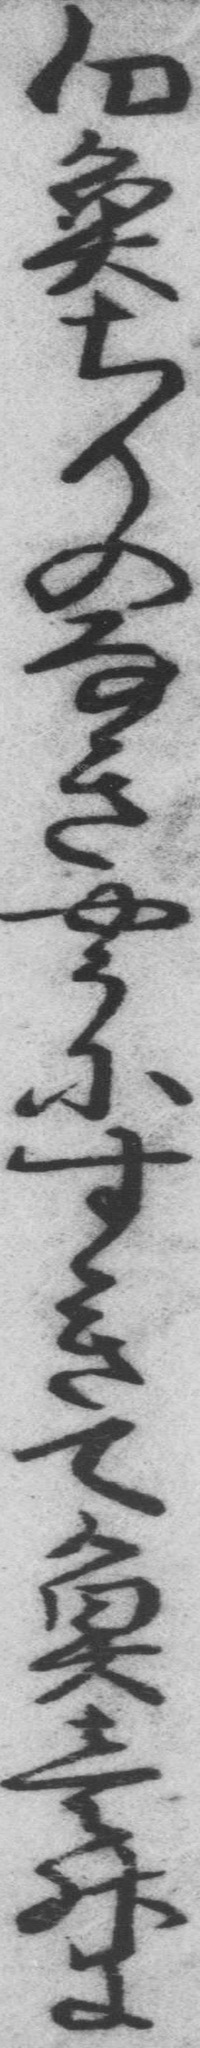白魚ちりのなきやうにすゝきて魚壱升に
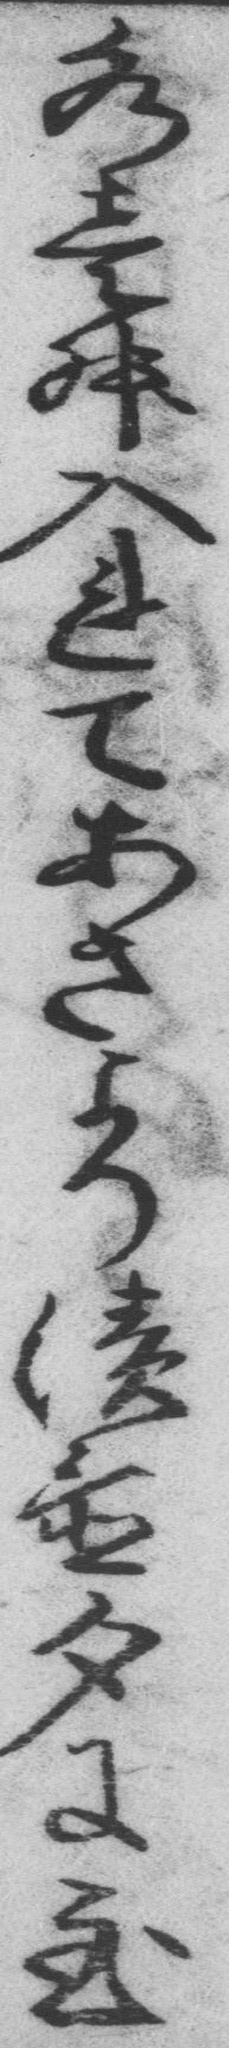水壱升入れてあさより漬置夕に至
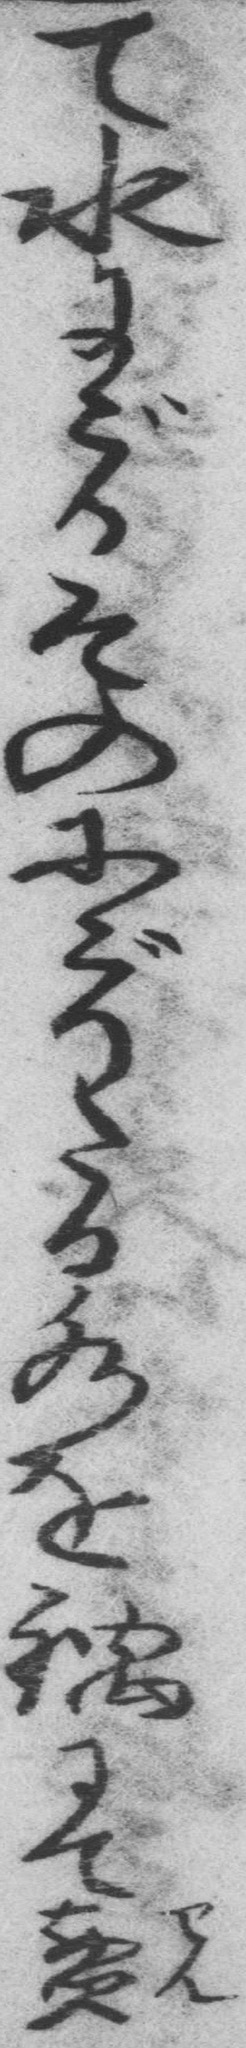て水にごるそのにごりたる水を鍋にて煎
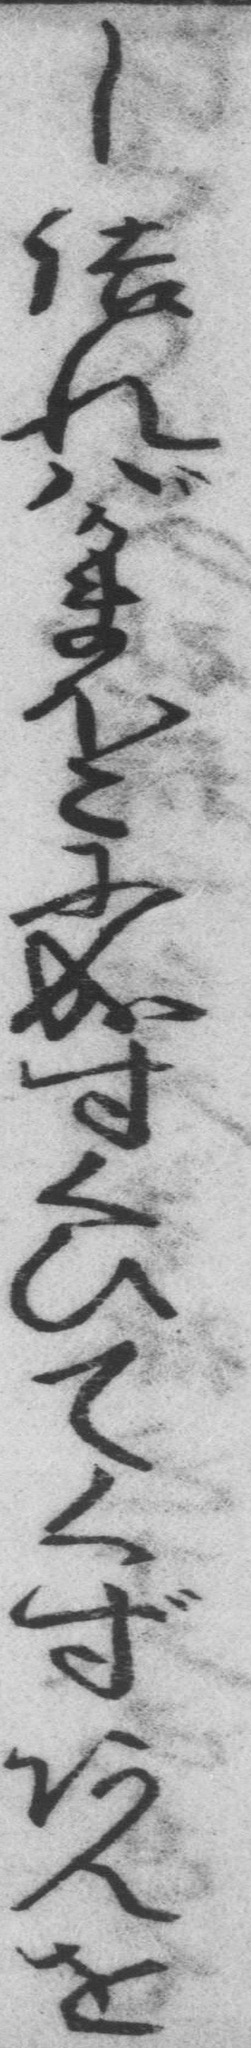し詰ればかまほこに成すくひてくずあんを
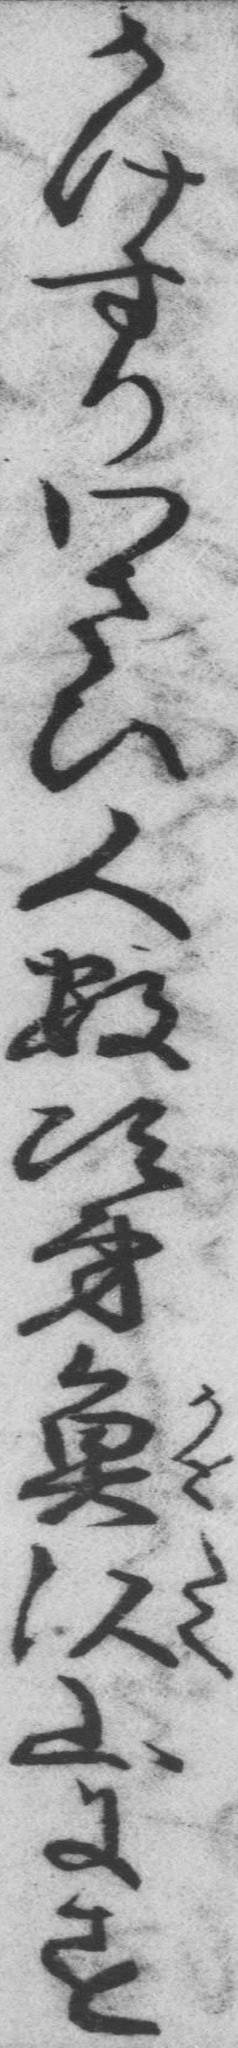かけすりわさひ人数次第魚沢山にす
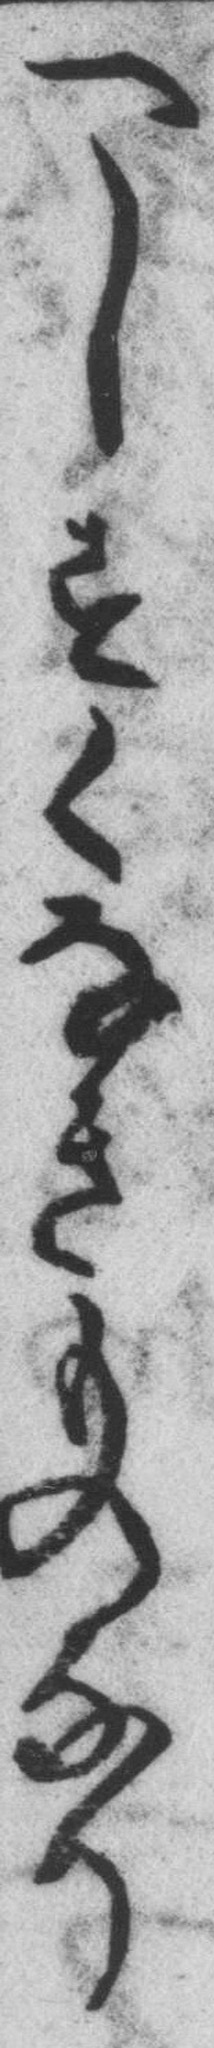へしすくなきものなり
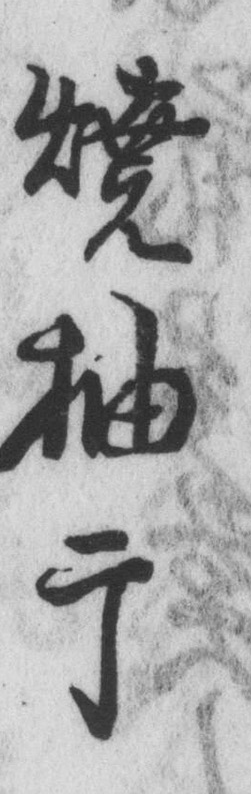焼柚干
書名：料理山海郷
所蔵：大阪府立大学学術情報センター 国文学研究資料館
